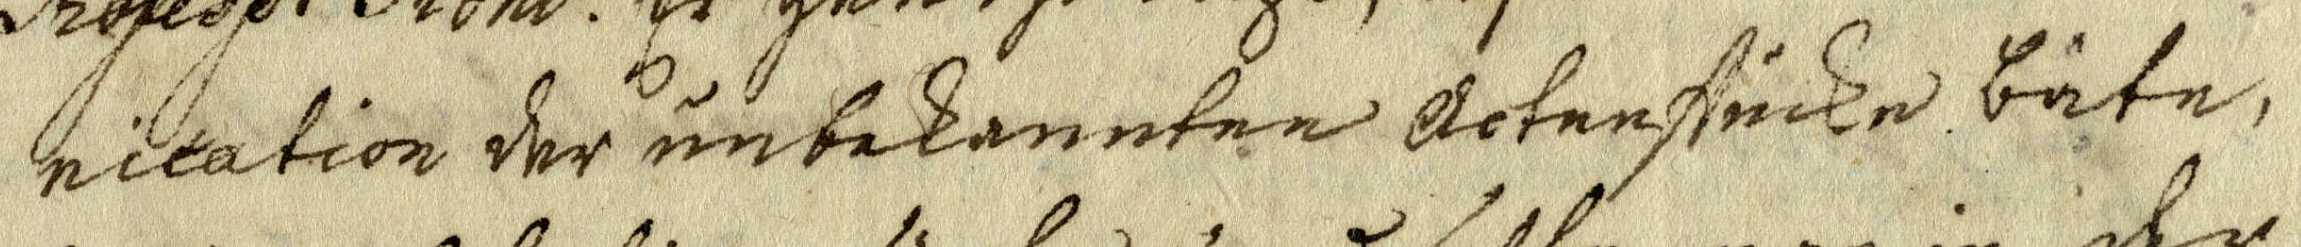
nication der unbekannten Actenstücke bäte,
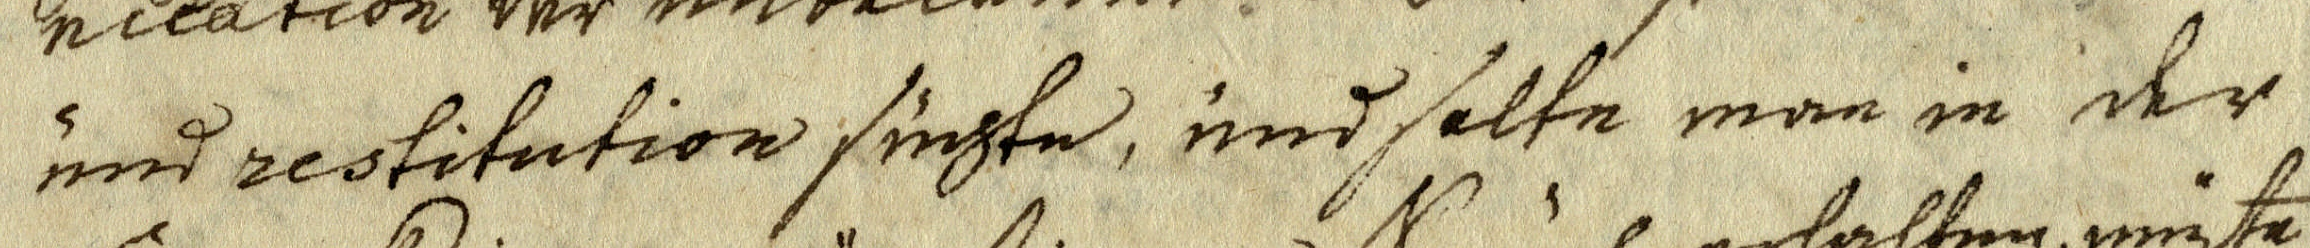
und restitution suchte, und solte man in der
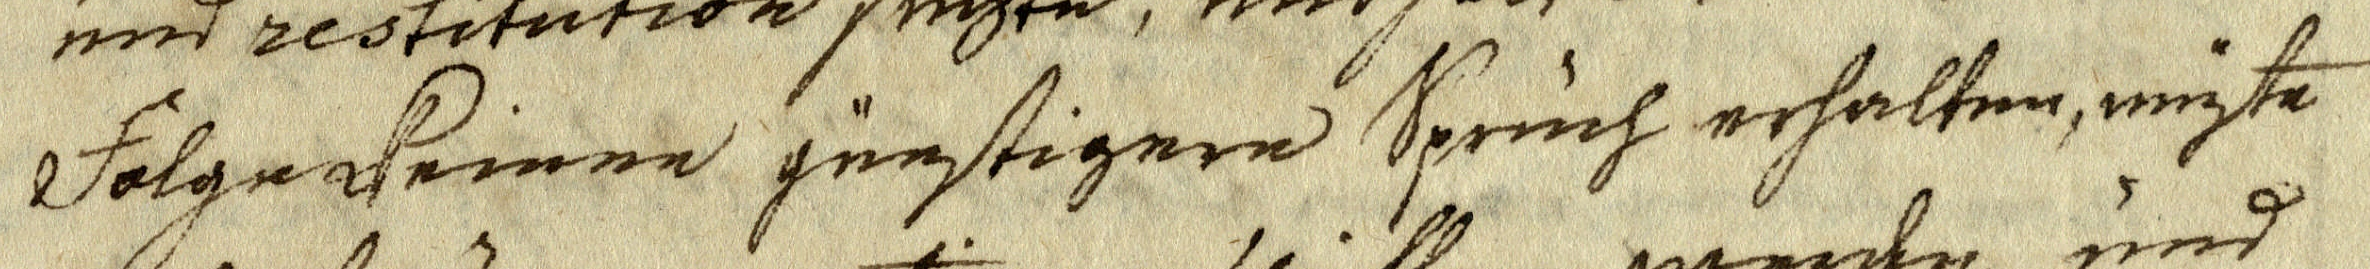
Folge keinen günstigern Spruch erhalten, müste
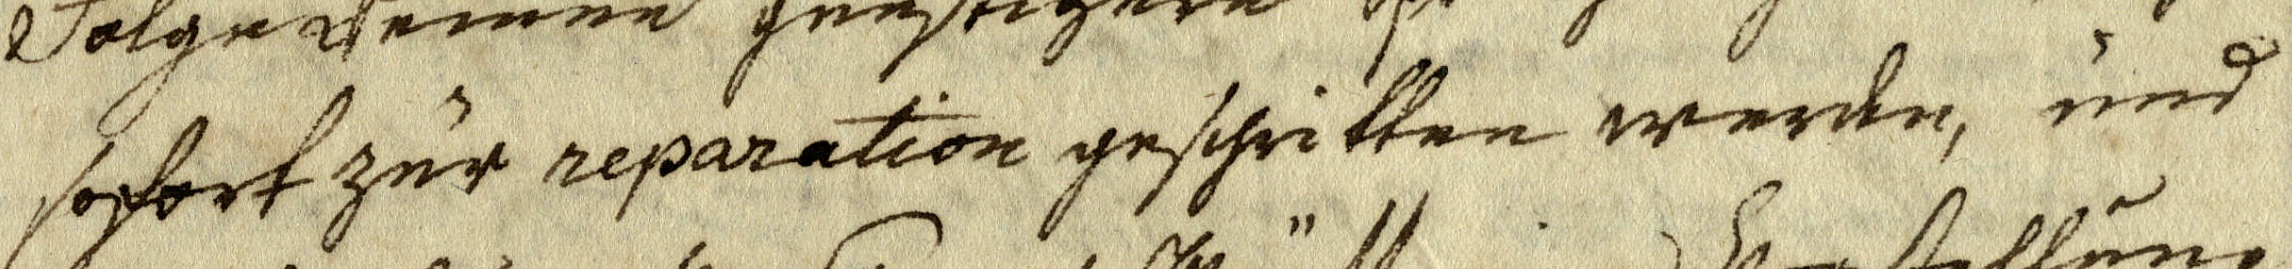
sofort zur reparation geschritten werden, und
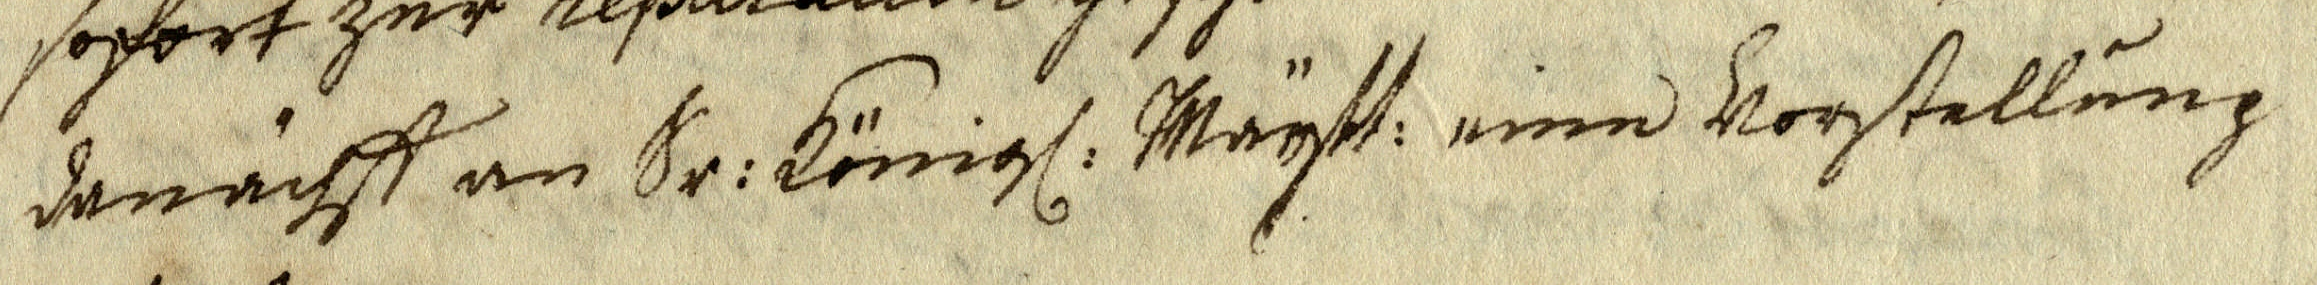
danächst an Sr Königl. Maÿtt. eine Vorstellung
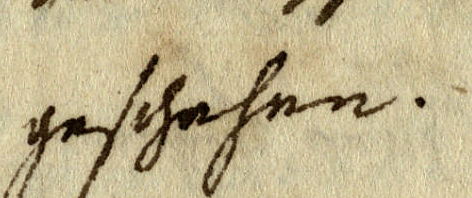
geschehen.
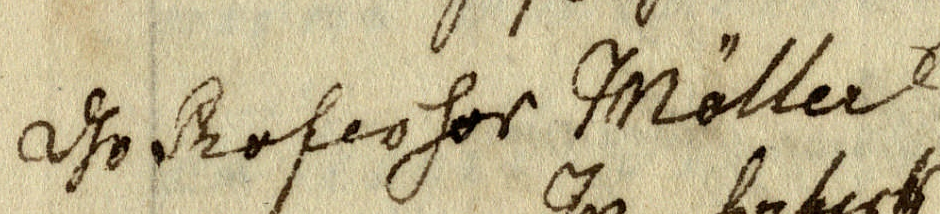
dh Professor Möller
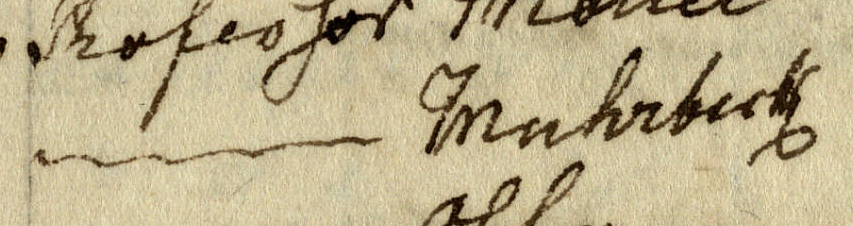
Muhrbeck
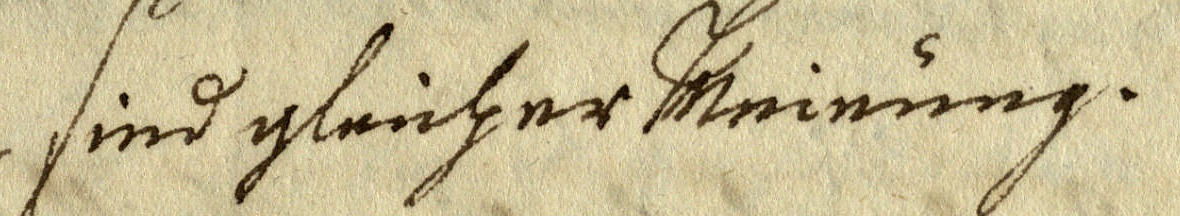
sind gleicher Meinung.
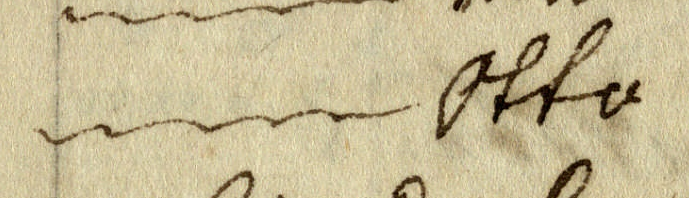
Otto.
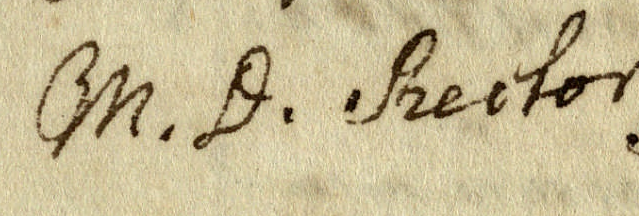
M. D. Rector
